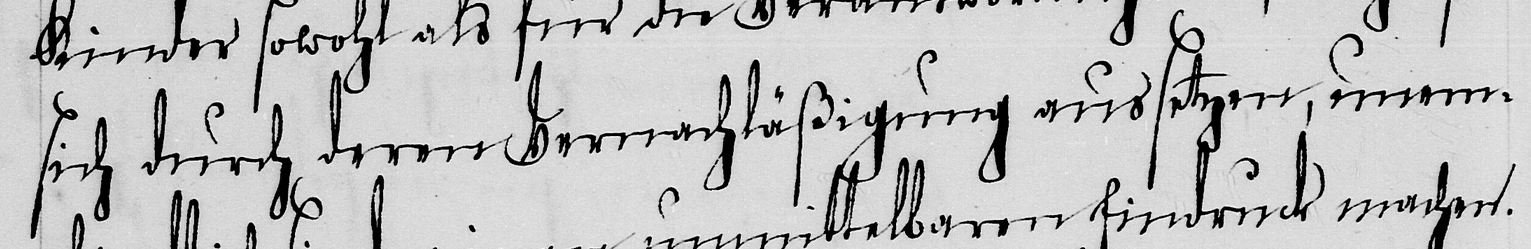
sich durch deren Vernachläßigung aussetzen, unem¬
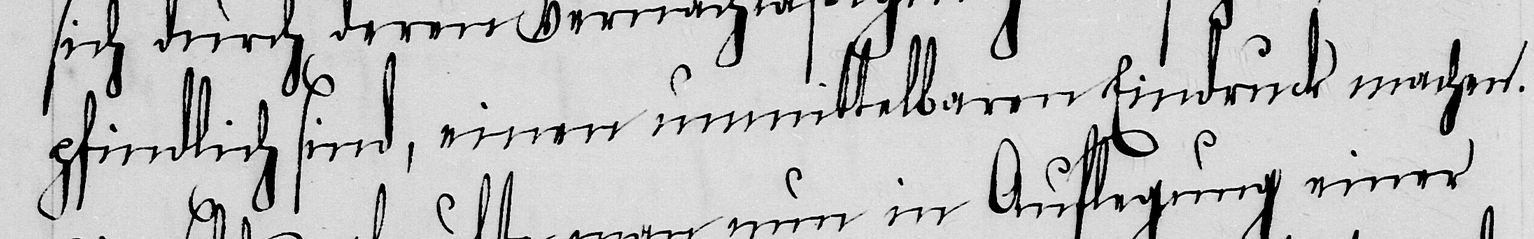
pfindlich sind, einen unmittelbaren Eindruck machen.
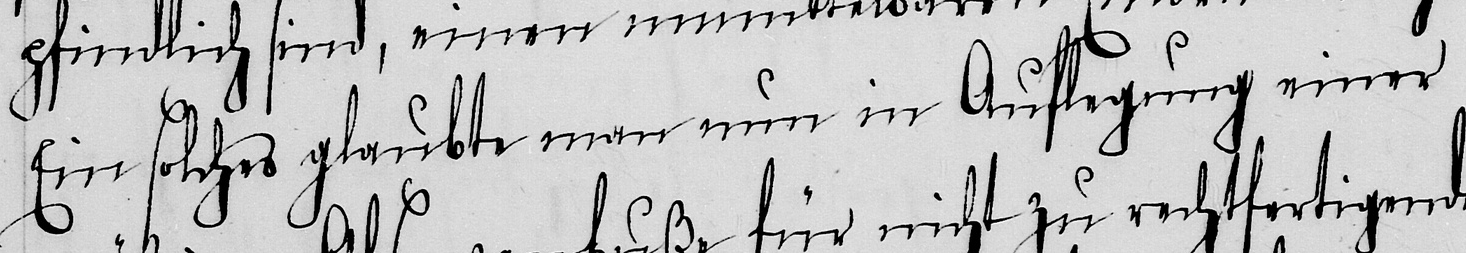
Ein solches glaubte man nun in Auflegung einer
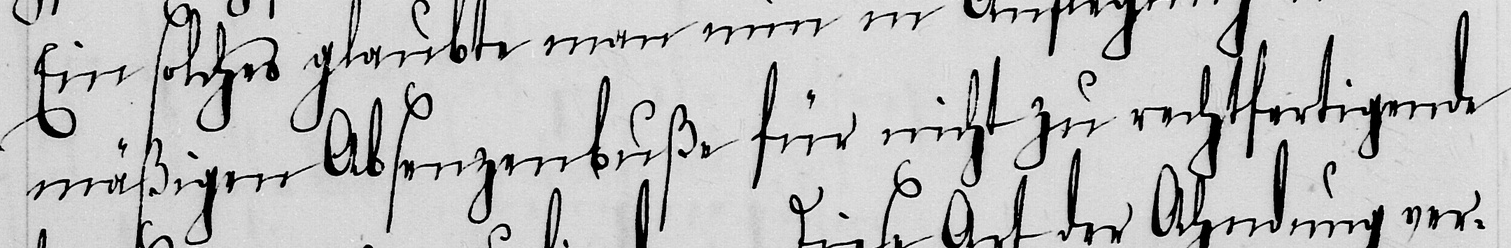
mäßigen Absenzenbuße für nicht zu rechtfertigende
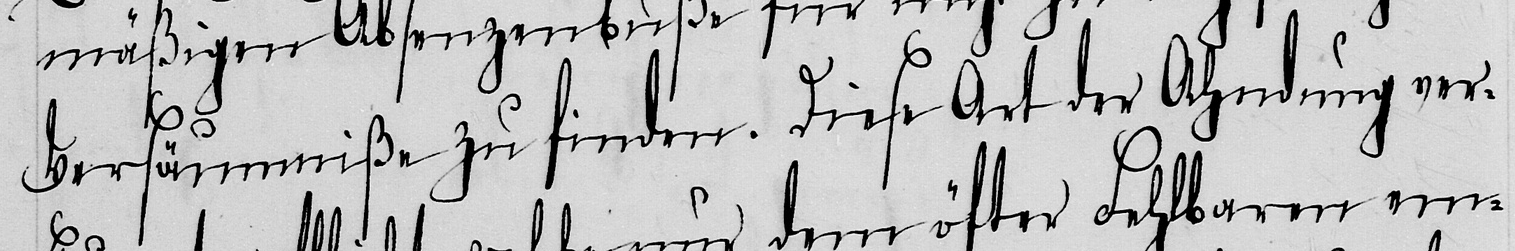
Versäumniße zu finden. Diese Art der Ahndung ver¬
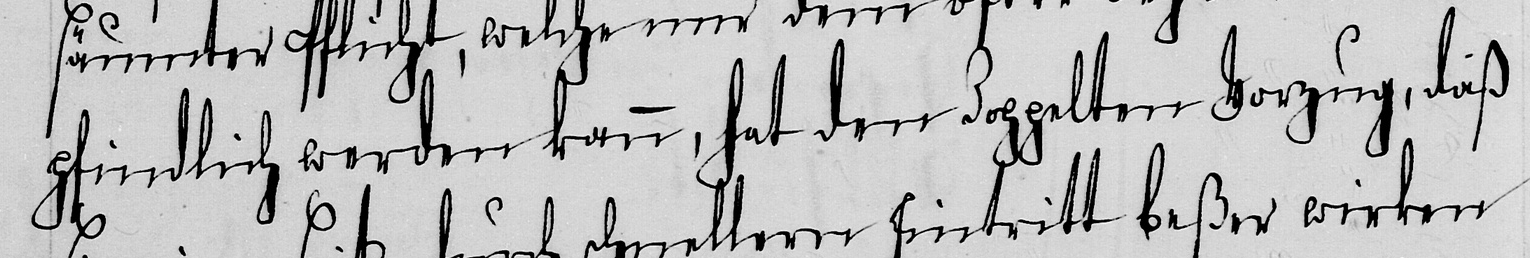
pfindlich werden kann, hat dem doppelten Vorzug daß
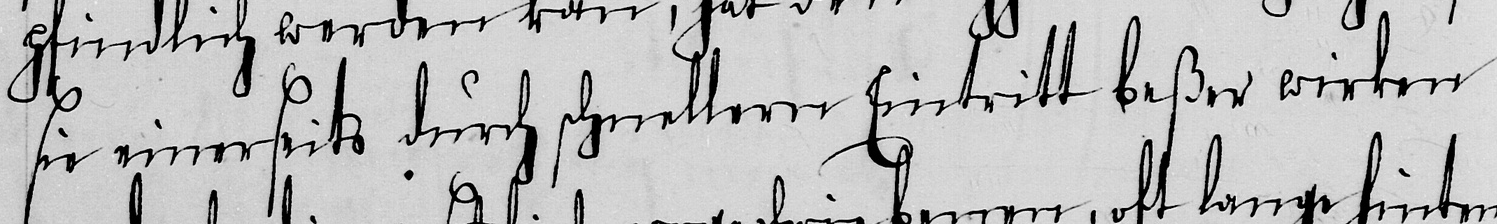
sie einerseits durch schnellern Eintritt beßer wirken
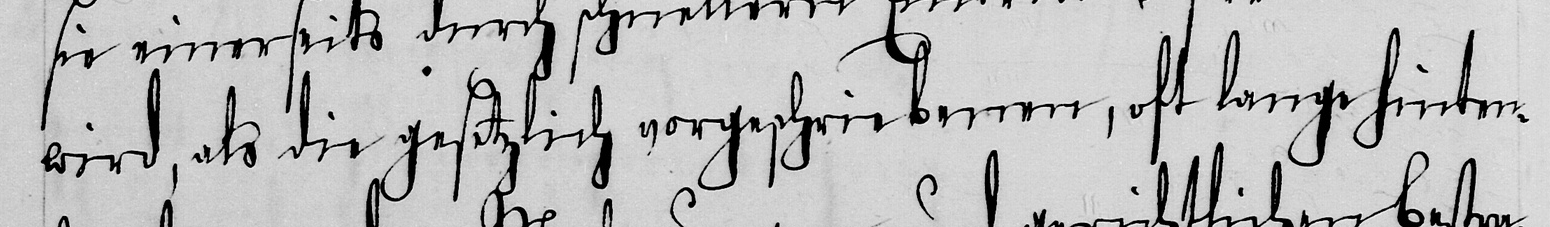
wird, als die gesetzlich vorgeschriebenen, oft lange hinten¬
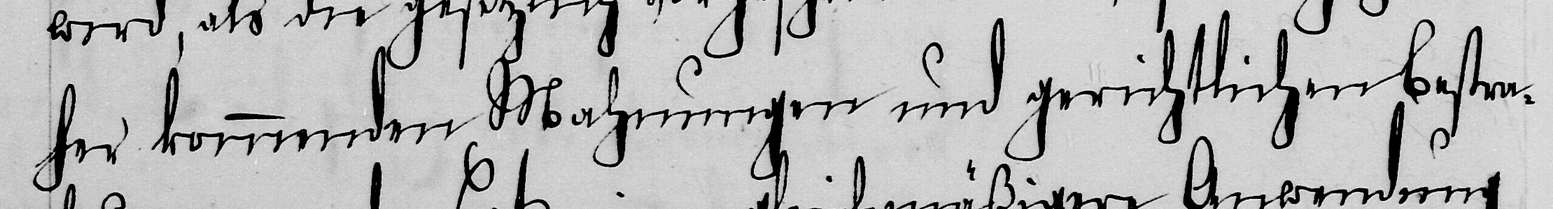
her kommenden Mahnungen und gerichtlichen Bestra¬
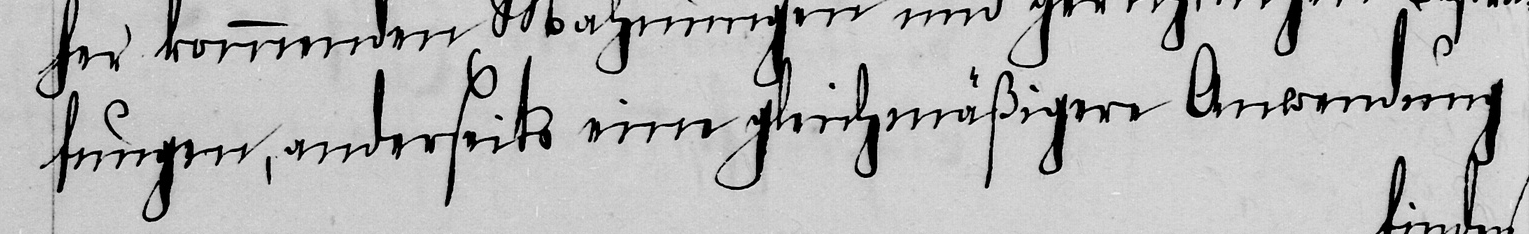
fungen, anderseits eine gleichmäßigere Anwendung
